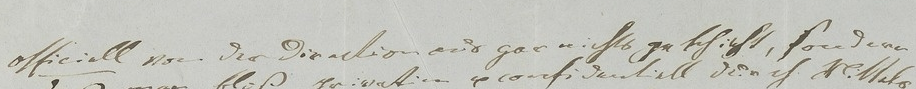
officiell von der Direction aus gar nichts geschieht, sondern
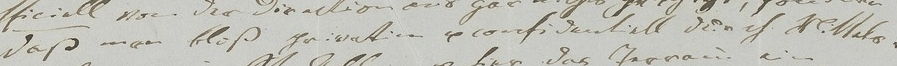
daß man bloß privatim & confidentiell durch Mittels-
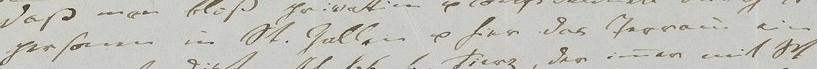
personen in St. Gallen & hier das Terrain ein
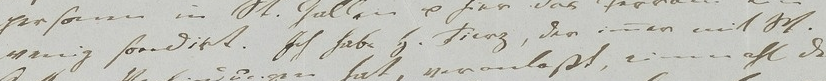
wenig sondirt. Ich habe H. Fierz, der immer mit St.
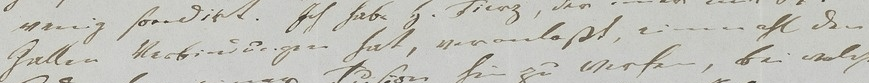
Gallen Verbindungen hat, veranlaßt, einmahl den
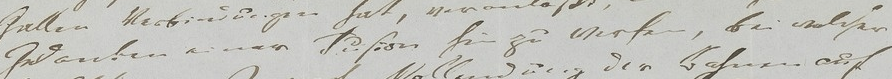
Gedanken einer Fusion hin zu werfen, bei welcher
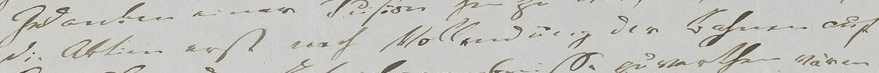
die Aktien erst nach Vollendung der Bahnen auf
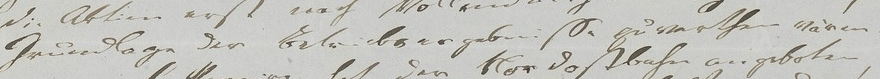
Grundlage der Betriebsergebniße zu werthen wären.
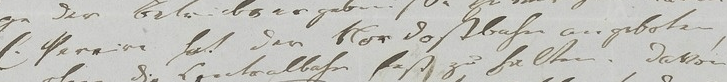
E. Pereire hat der Nordostbahn angeboten,
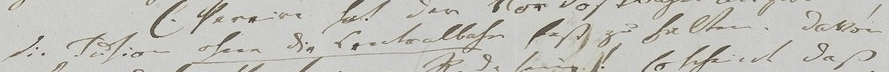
die Fusion ohne die Centralbahn fest zu halten. Davon
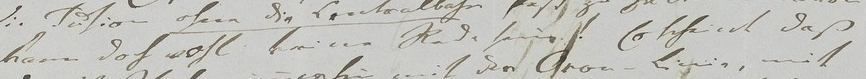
kann doch wohl keine Rede sein! Es scheint daß
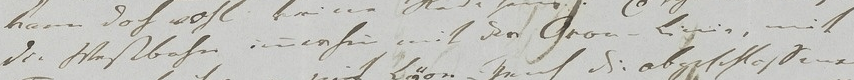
die Westbahn immerhin mit der Oron-Linie, mit
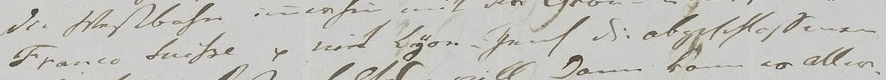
Franco Suisse & mit Lyon–Genf die abgeschloßenen
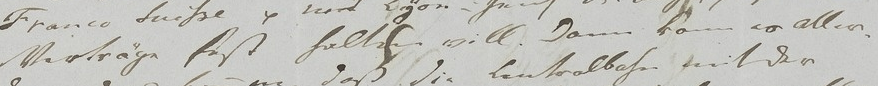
Verträge fest halten will. Dann kann es aller-
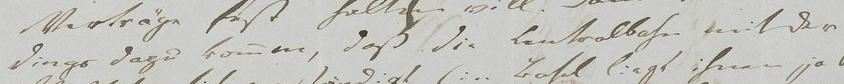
dings dazu kommen, daß die Centralbahn mit der
